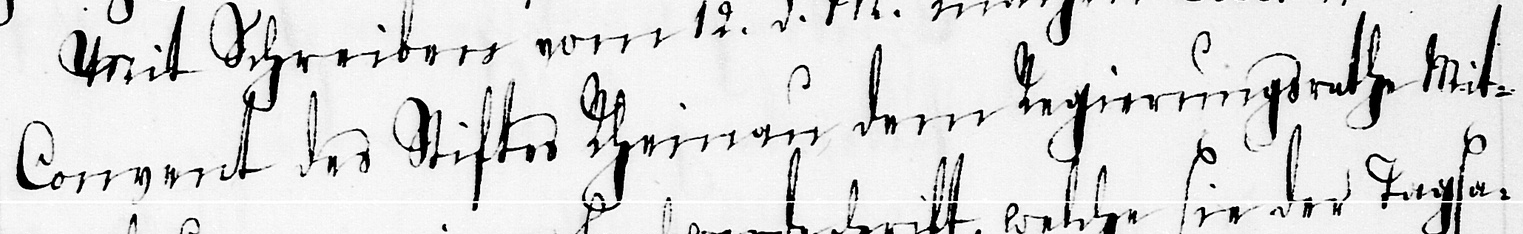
Convent des Stiftes Rheinau dem Regierungsrath Mit¬
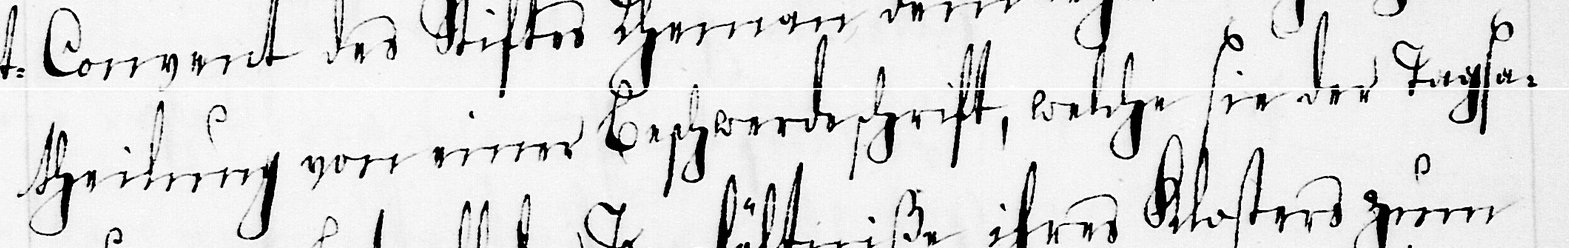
theilung von einer Beschwerdeschrift, welche sie der Tagsa¬
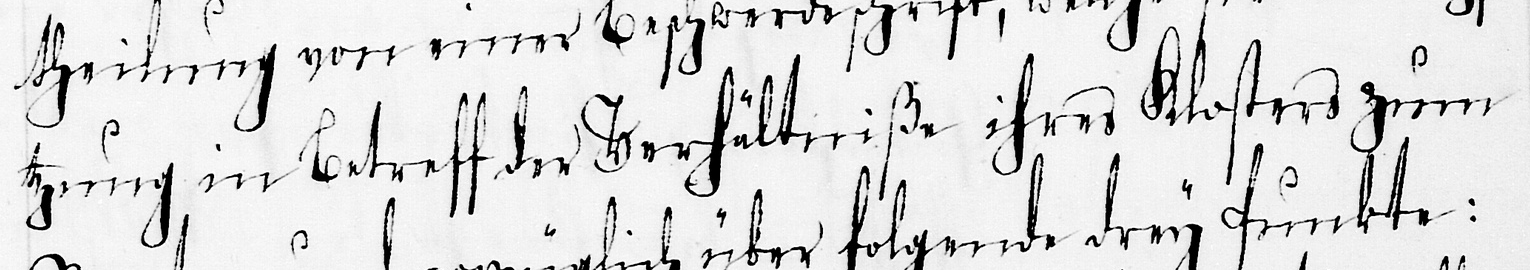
tzung in Betreff der Verhältniße ihres Klosters zum
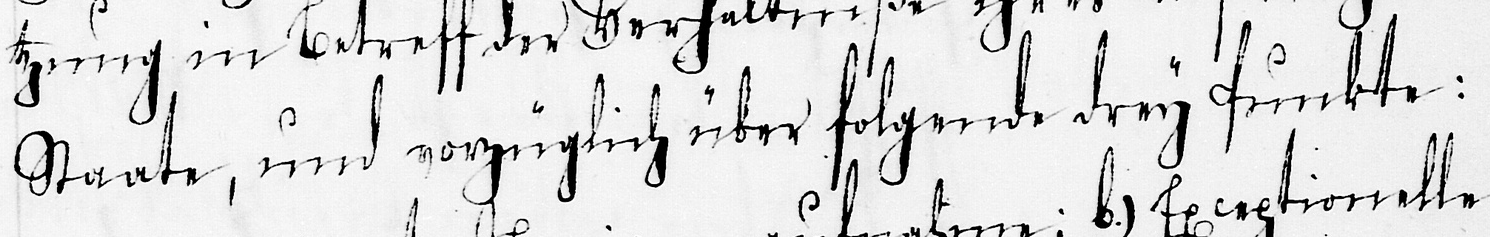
Staate, und vorzüglich über folgende drey Punkte:
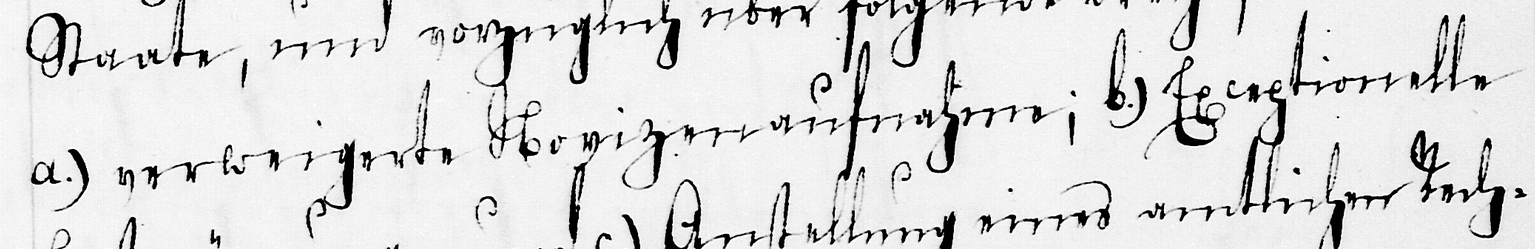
a.) verweigerte Novizenaufnahme; b.) Exceptionelle
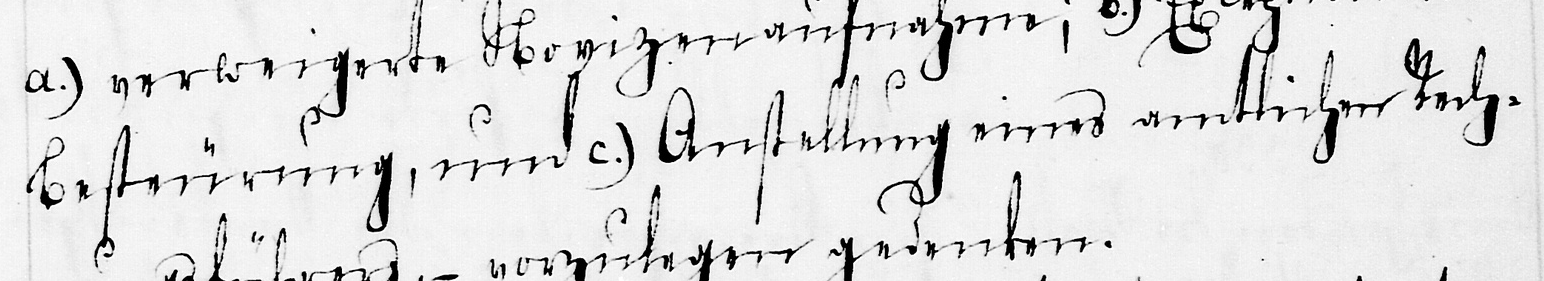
Besteurung, und c.) Anstellung eines amtlichen Rech¬
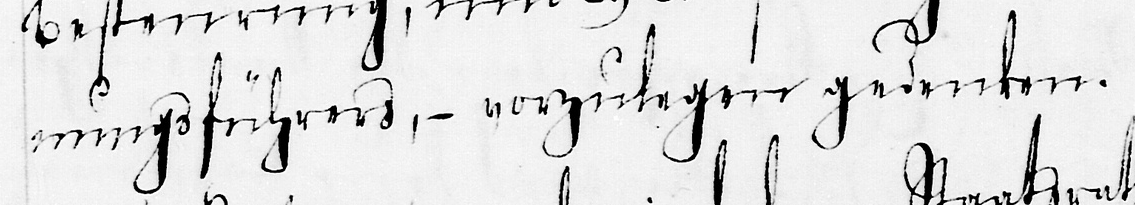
nungsführers, – vorzulegen gedenken.
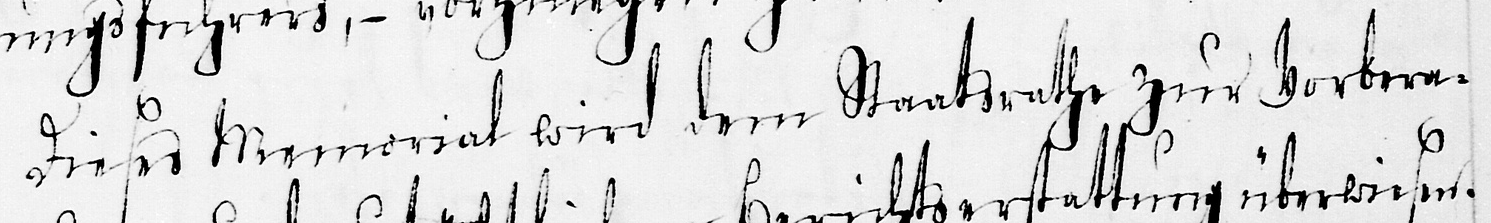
Dieses Memorial wird dem Staatsrathe zur Vorbera¬
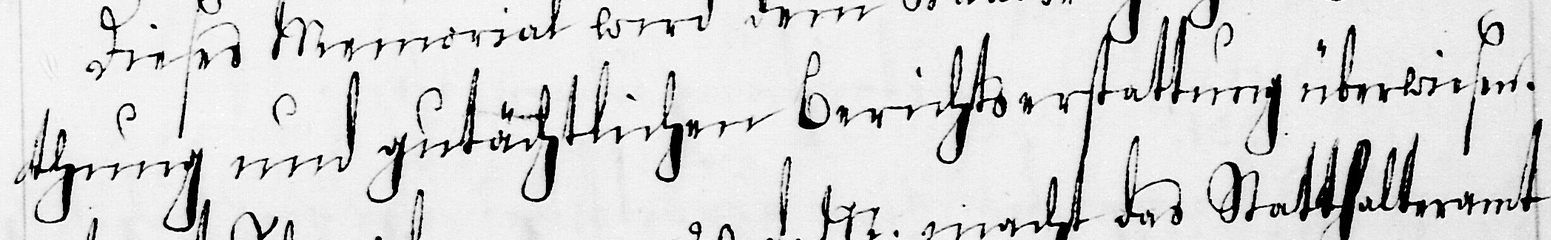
thung und gutächtlichen Berichtserstattung überwiesen.
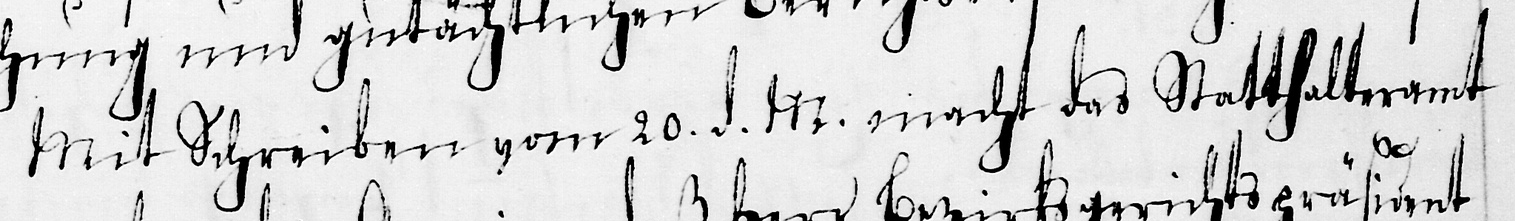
Mit Schreiben vom 20. d. M. macht das Statthalteramt
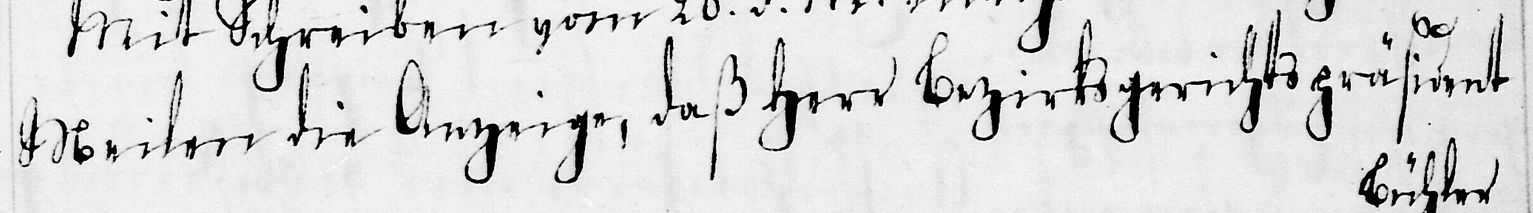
Meilen die Anzeige, daß Herr Bezirksgerichtspräsident
